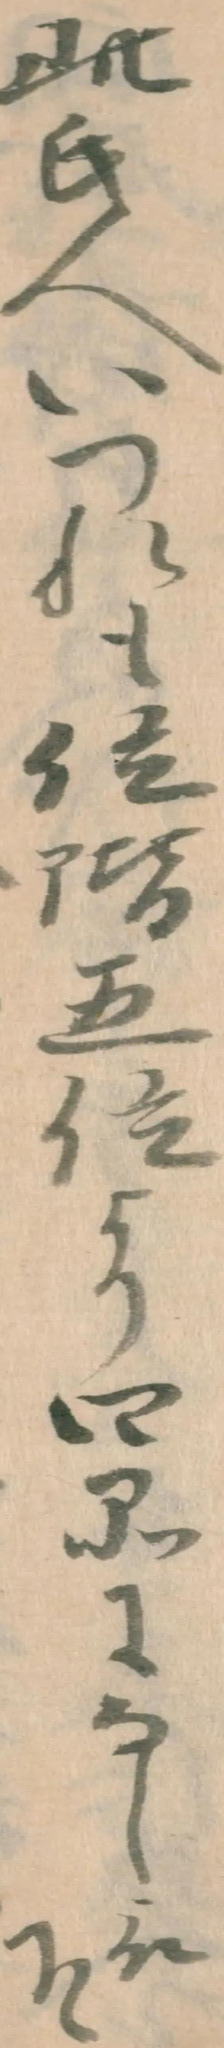此氏人いつれも位階五位より四品になし被下候
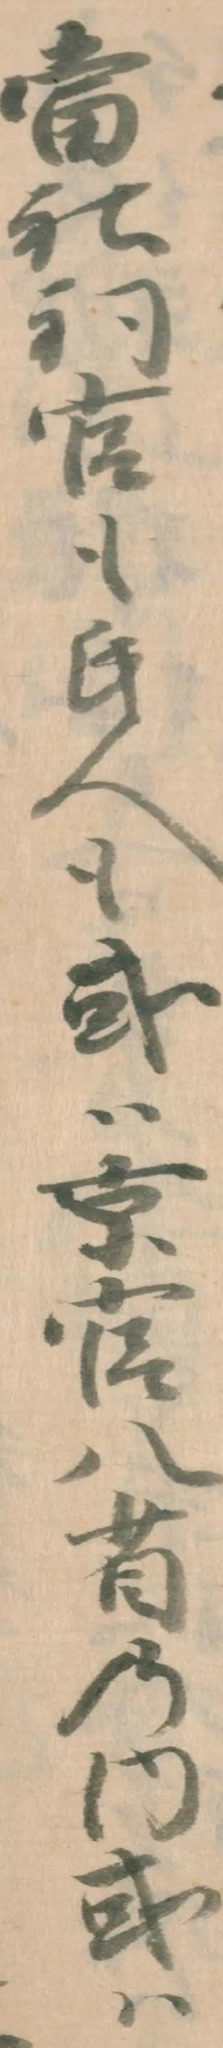當社祠官も氏人も或は京官八省の内或は
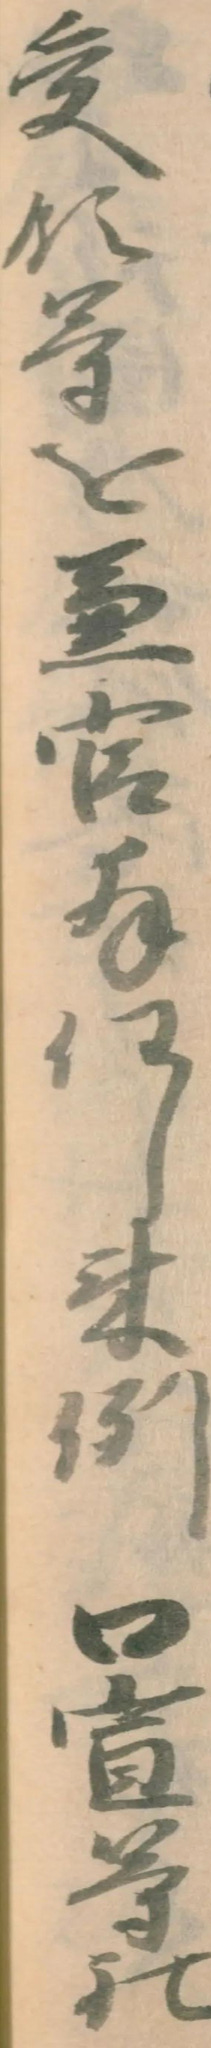受領等を兼官拝任し来例口宣等社
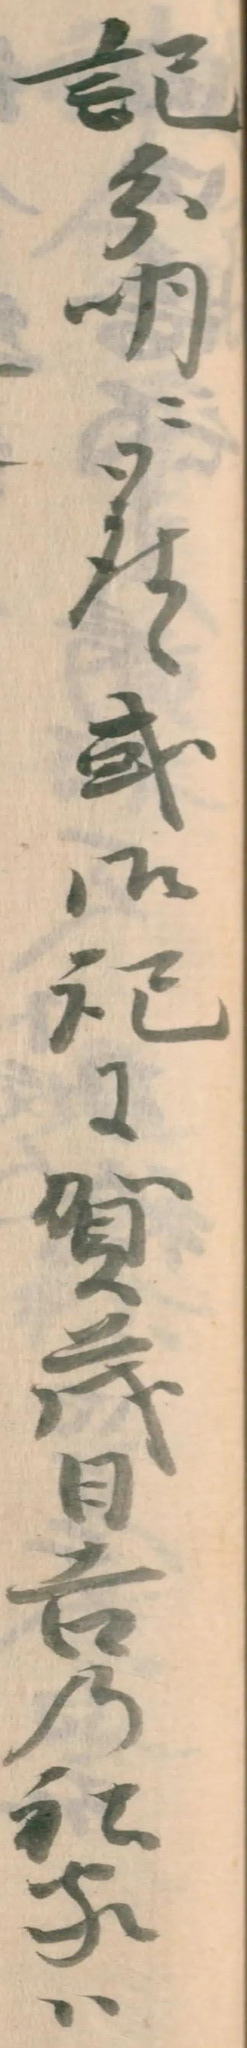記分明御座候或御記に賀茂日吉の社家は
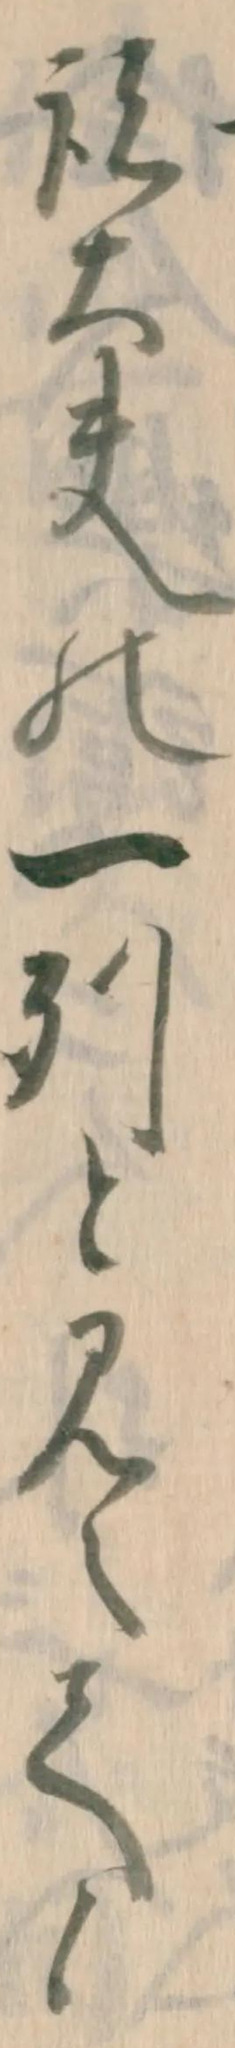諸大夫の一列と見えて候
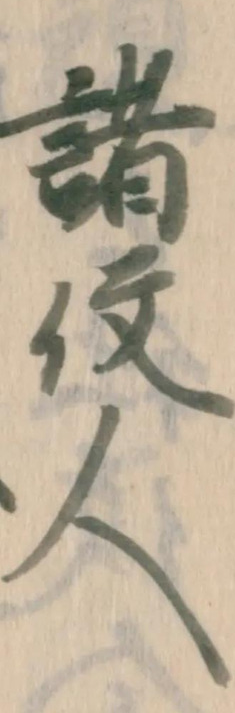諸役人

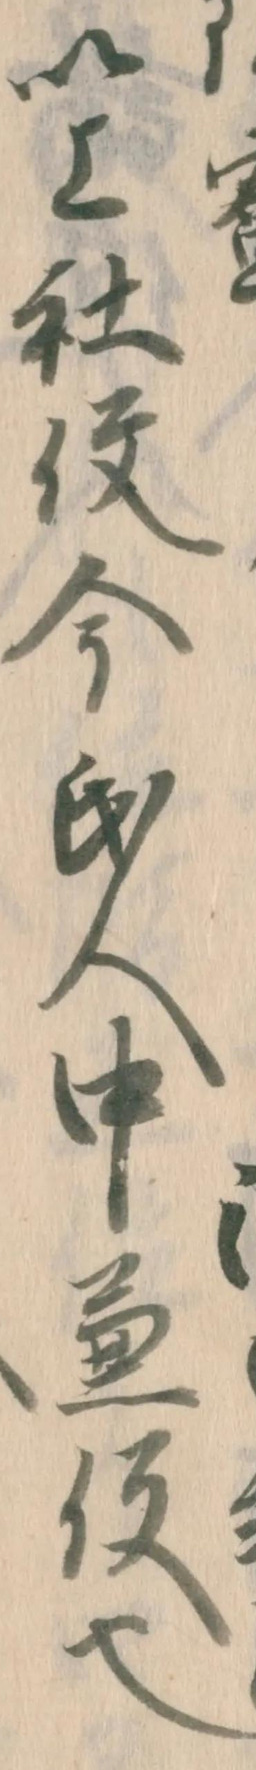以上社役今氏人中兼役也
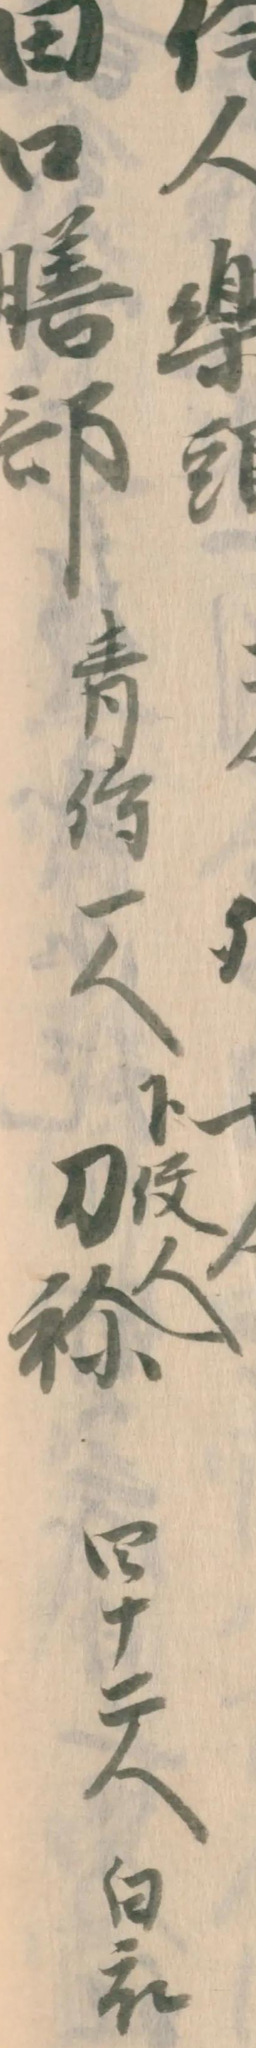田口膳部青侍一人刀祢四十二人白衣

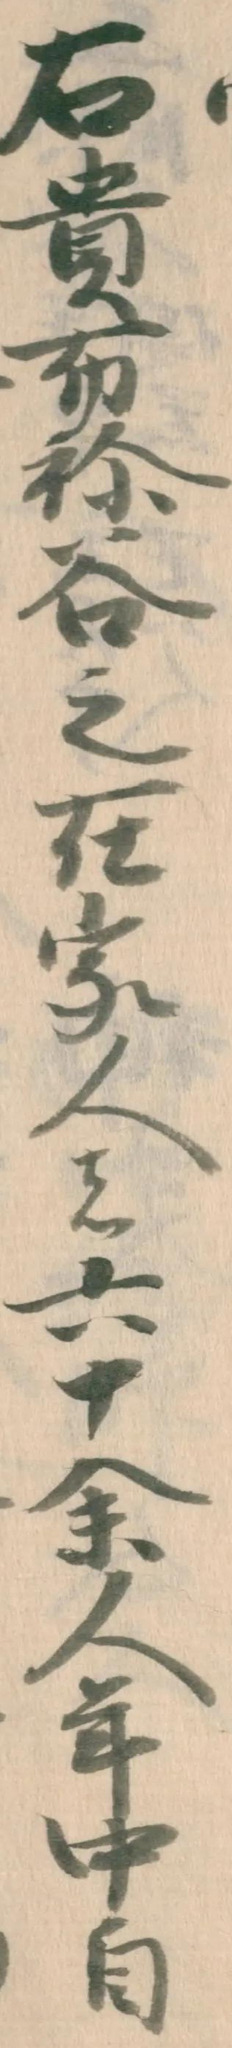右貴ふね谷之在家人は六十余人年中自
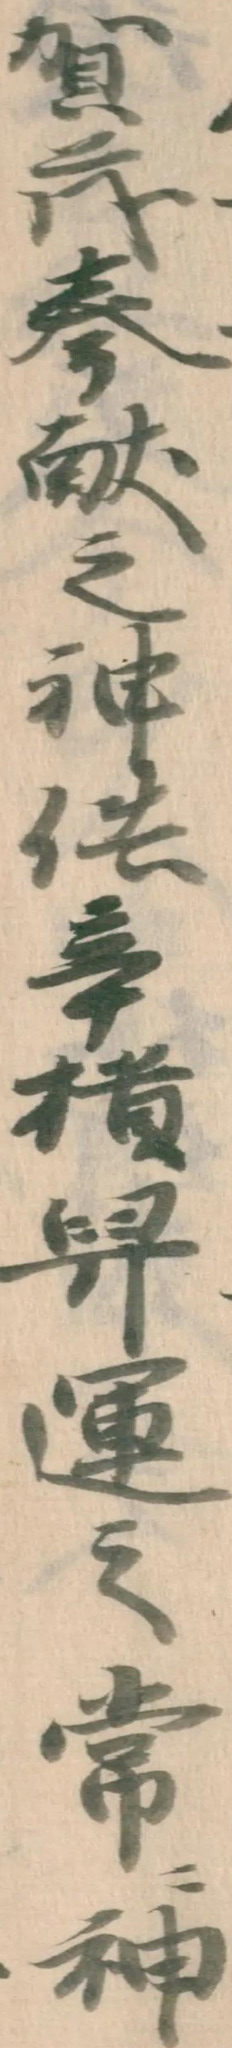賀茂奉献之神供辛櫃舁運之常神
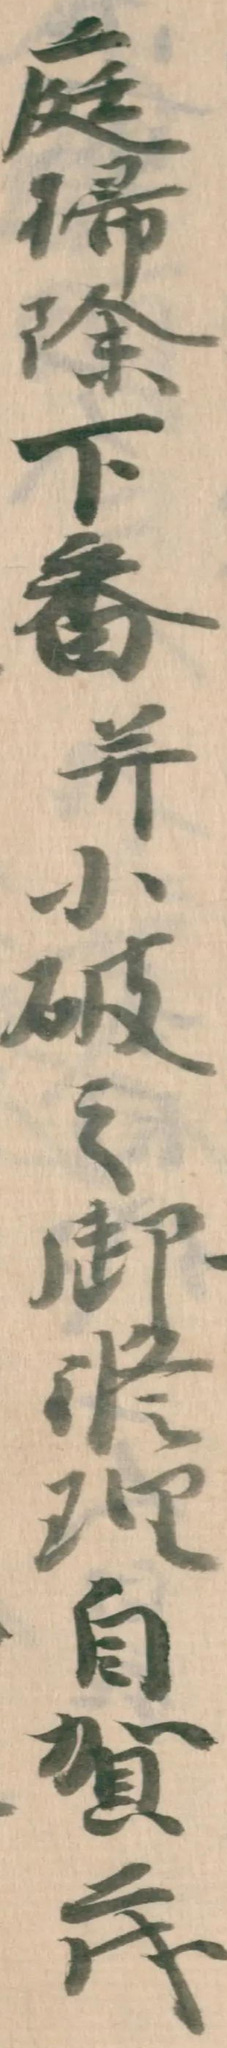庭掃除下番并小破之御修理自賀茂
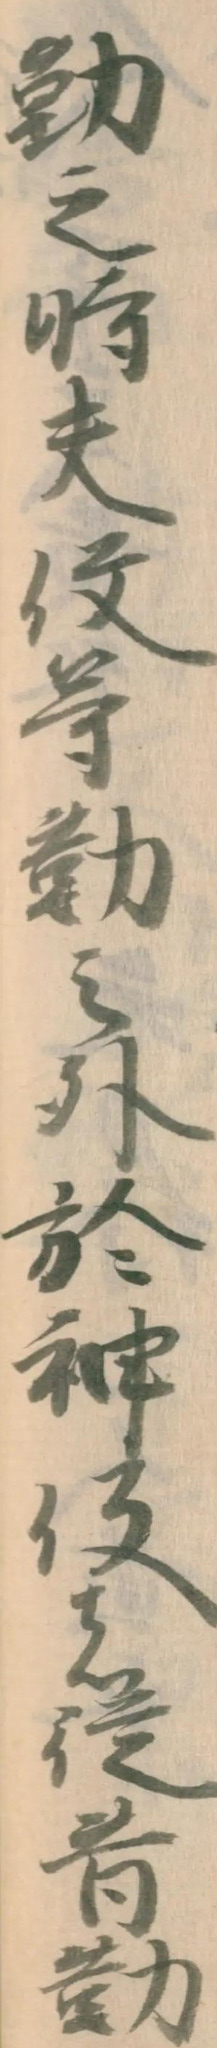勤之時夫役等勤之外於神役は従昔勤
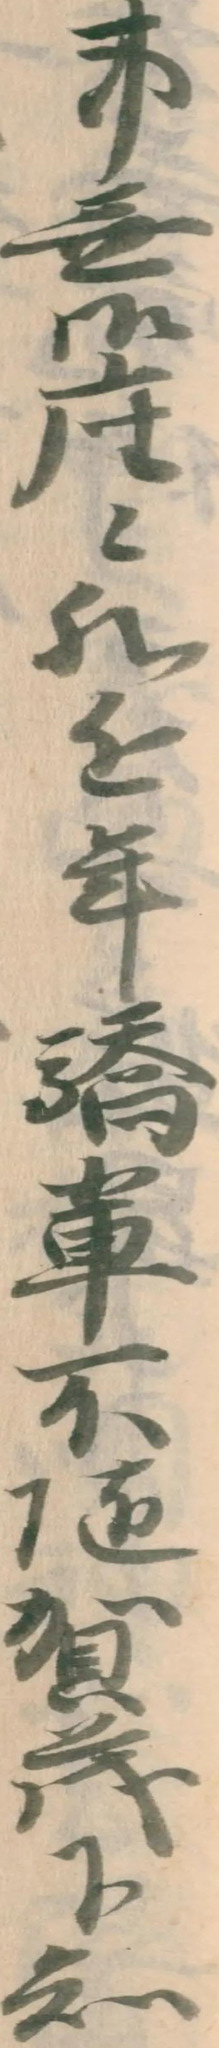事無御座候然近年驕輩不随賀茂下知
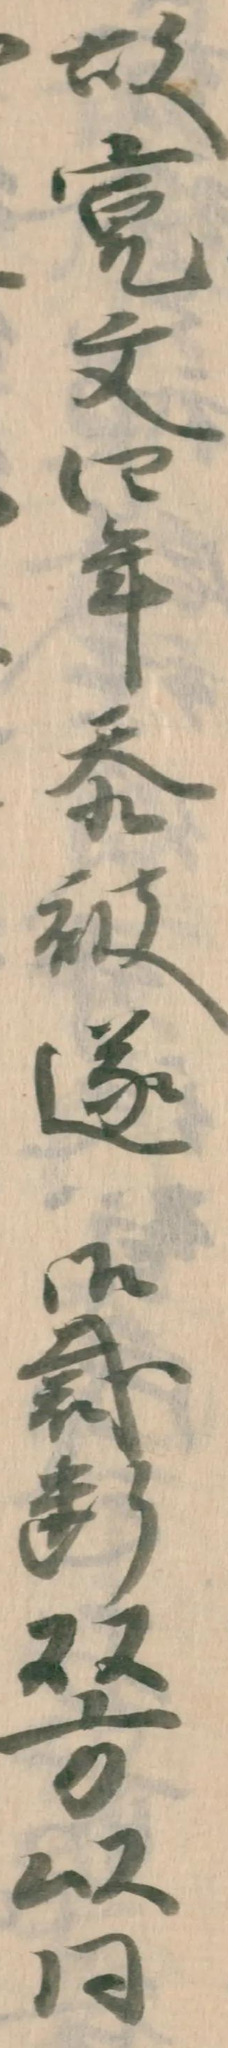故寛文四年忝被遂御裁断双方以同
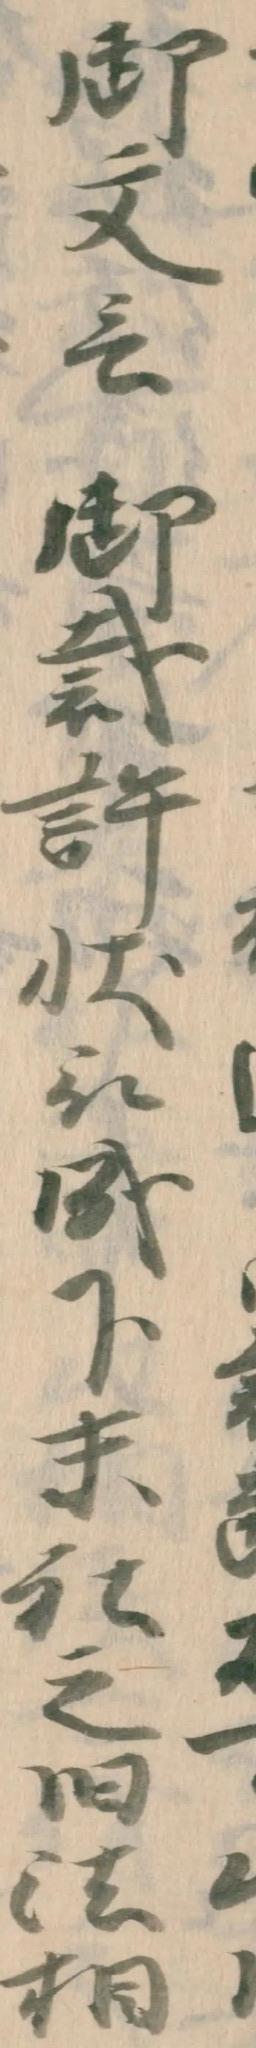御文言御裁許状被成下末社之旧法相
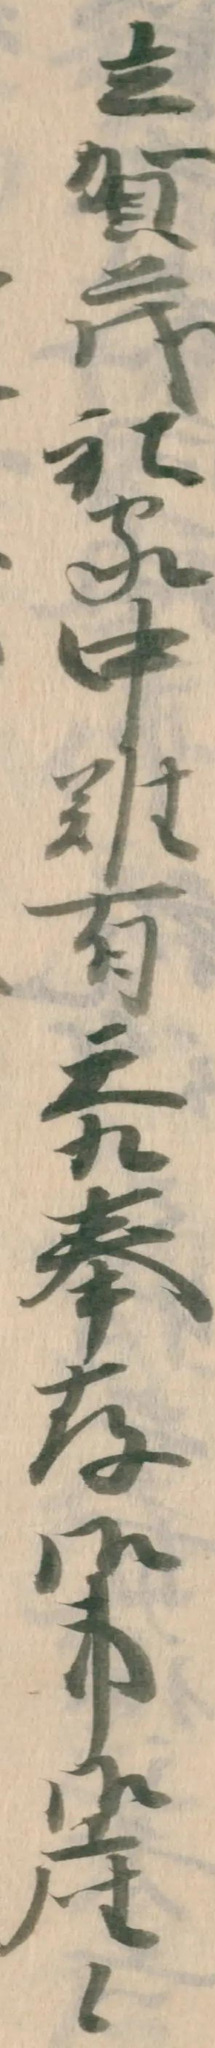立賀茂社家中難有忝奉存御事御座候
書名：賀茂社記録. 第1冊
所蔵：国立国会図書館 National Diet Library, JAPAN
